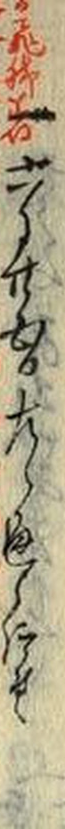一六月廿五日左之通被仰付候
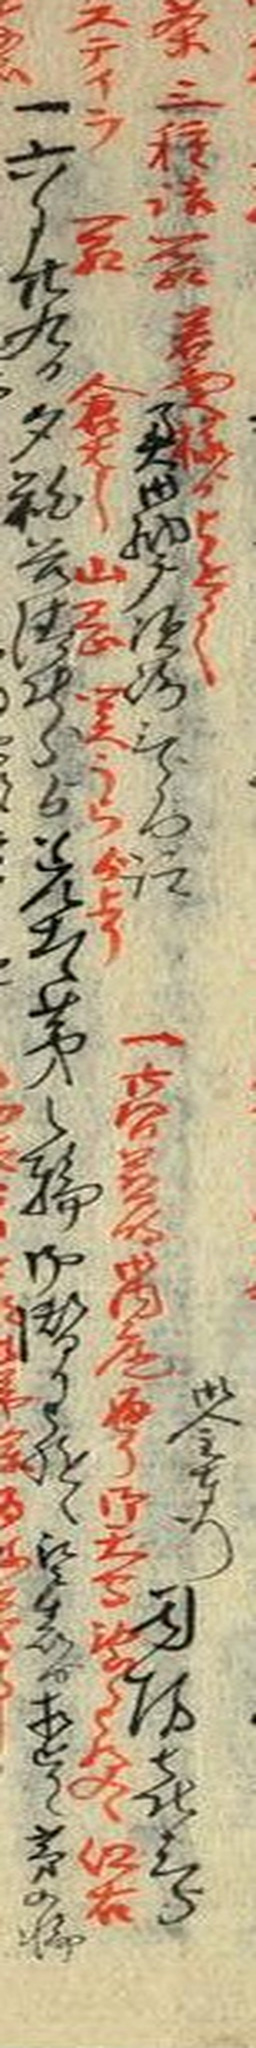一六月廿九日夕粕谷清次郎ゟ差出候茅之輪御潜り被遊候江戸表ゟ相廻り候茅の輪
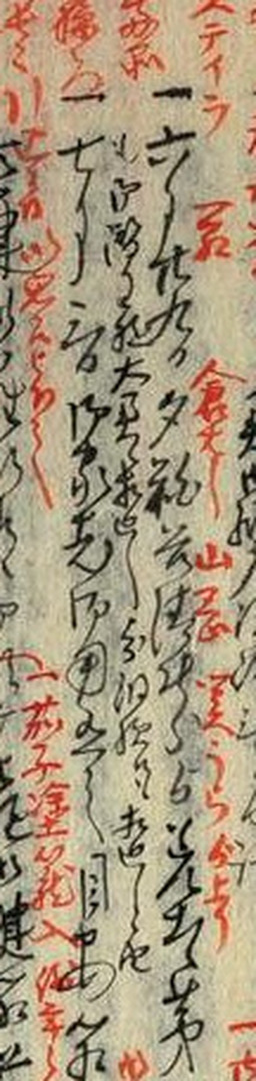も御潜り被遊大奥へ相廻し分銅様？江も相廻し候由
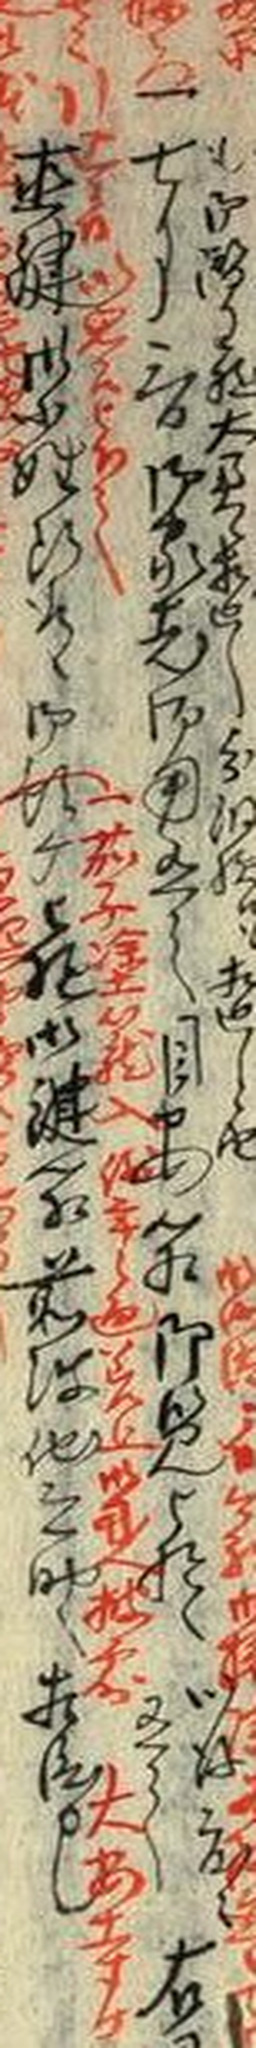直鍵御小姓頭取へ御預ケ被遊御鍵箱前波他之助へ相渡申候
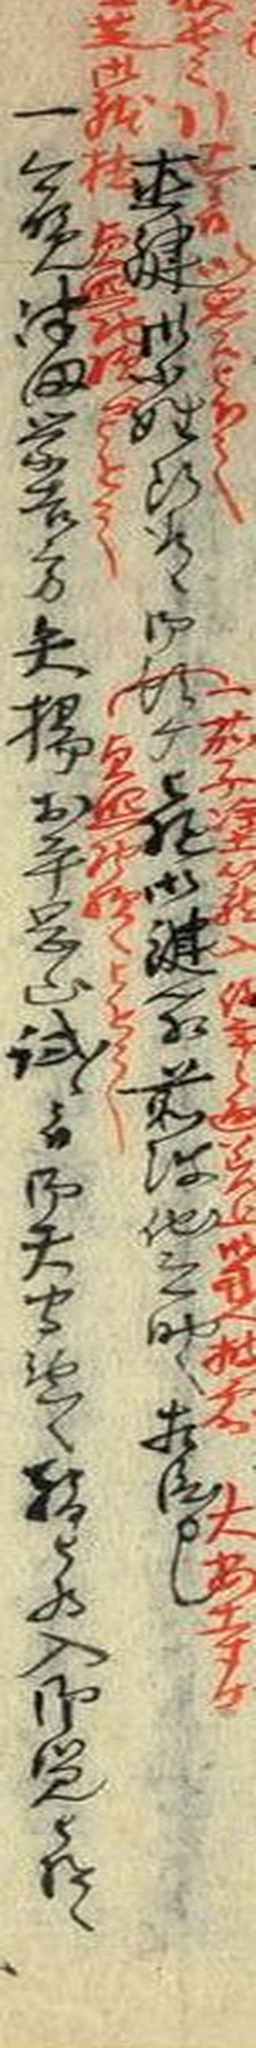一今晩津田栄吉方矢揚於平岡山試候ニ付御天守台へ暫被為入御覧被遊候
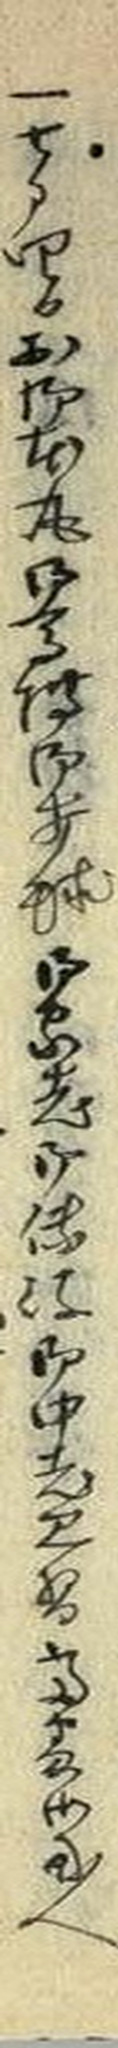一七月四日於御本丸御馬場御打毬御家老御傅役御中老見習当番御用人
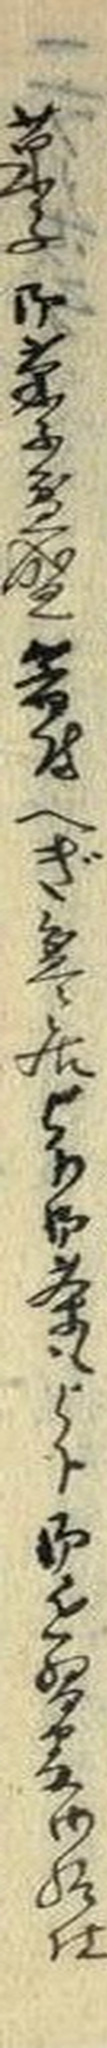菓子御菓子盆盛箸付へぎ盆ニ居被下御茶も被下御近習番御給仕
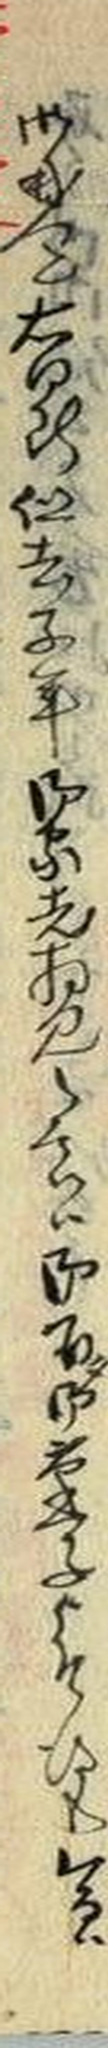御用人迄右同断但去子年御家老拝見之節ハ御下タ御菓子被下候得共今日ハ
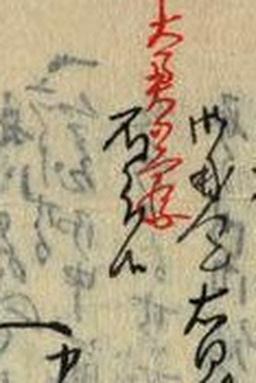不被下候
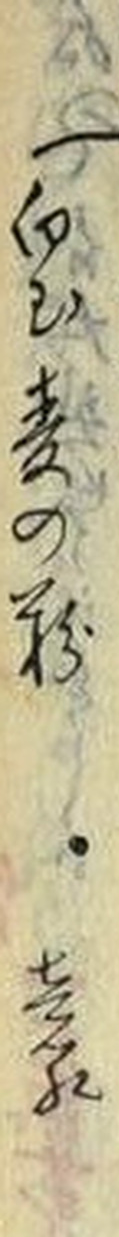白玉麦の粉壱箱
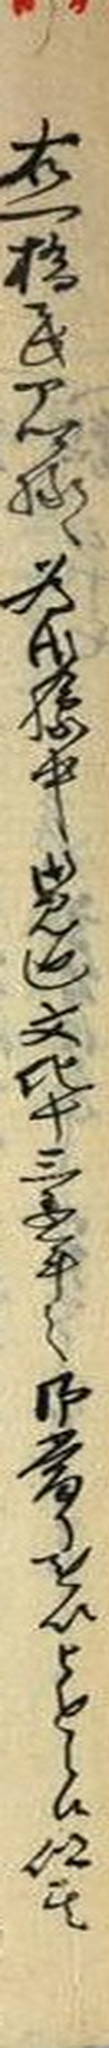右一橋民部卿様へ為御朦中御見廻文化十三子年之御当りを以被進之候但其
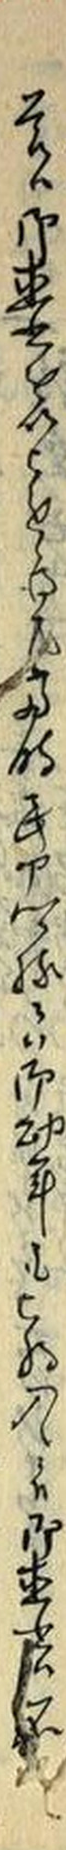節ハ御直書を以被進候得共当時民部卿様ニハ御幼年ニも被為入候ニ付御直書ハ不
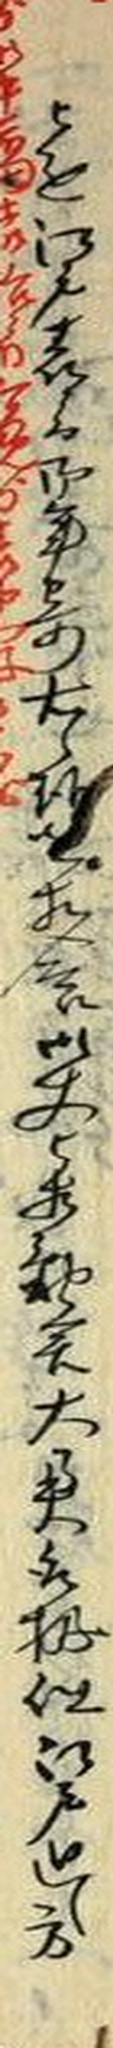被進江戸表ニ而御年寄右之趣を相含御使被相勤候筈大奥取扱但江戸廻し方
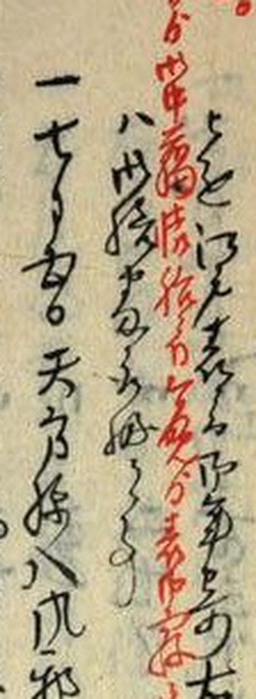ハ御膳番取扱ニ候事
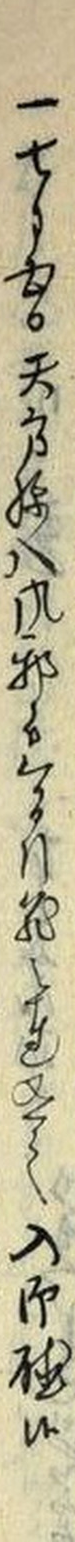一七月五日天方孫八風邪ニ付今日引籠之達有之入御聴候
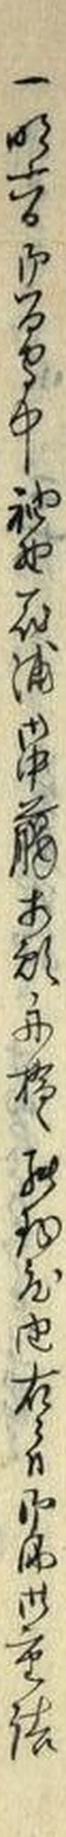一明六日御留守中袖野花浦御中臈相願舟橋へ罷越度由右ニ付御酒御重詰
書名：少傅日録抄（斉承付側向頭取日記、在国）
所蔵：福井県文書館 Fukui Prefectural Archives
